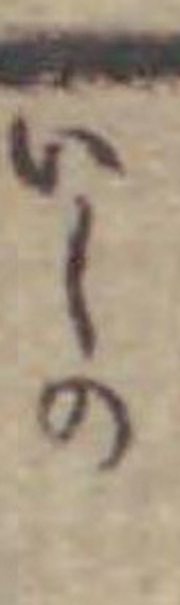いしの
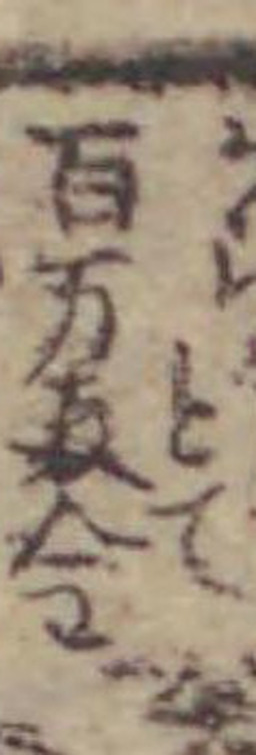百万両金
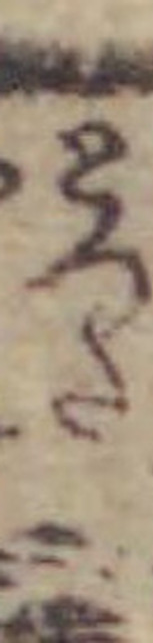とつた
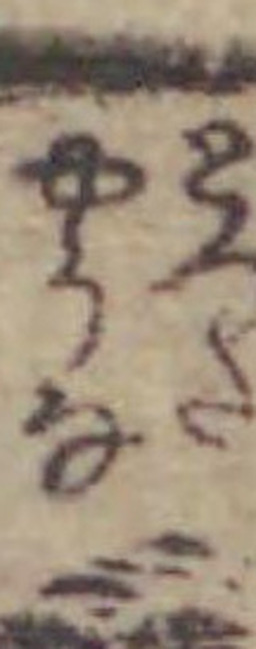やうな
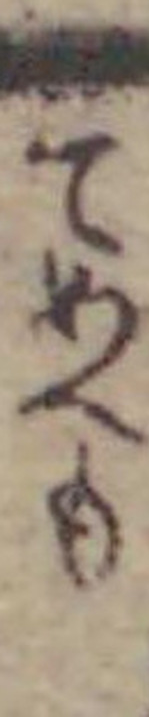てめへも
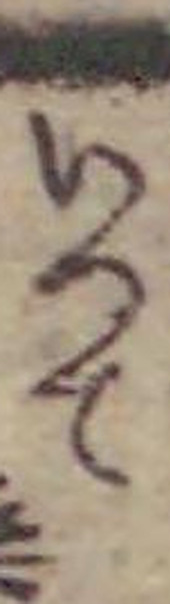いつて

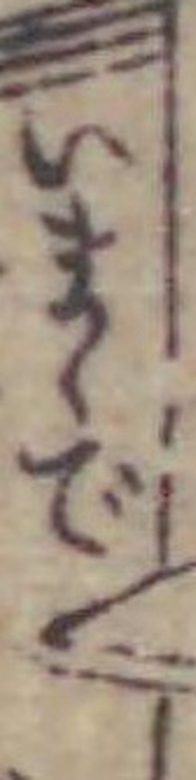いまゝで
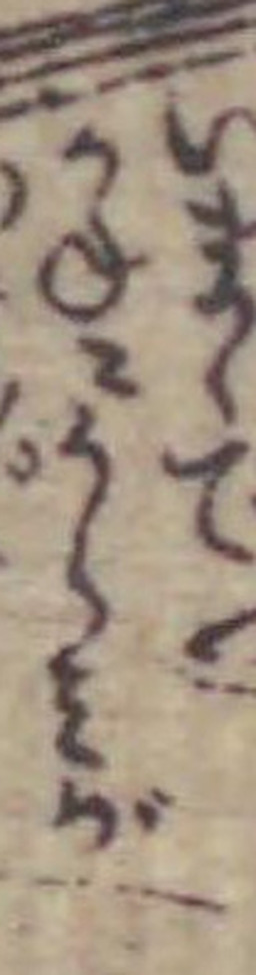かねにうらみが
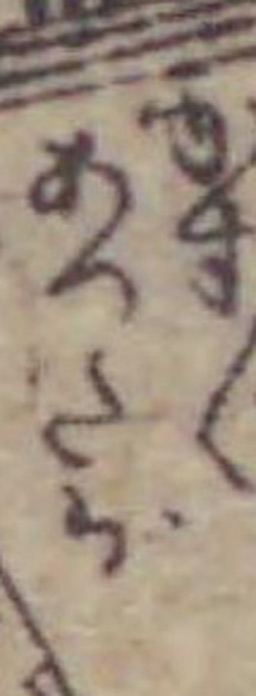あつたが
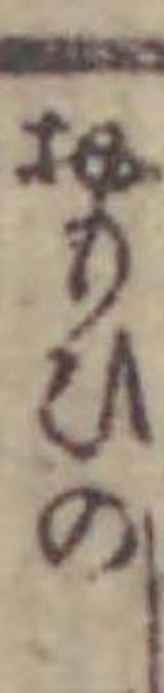おもひの
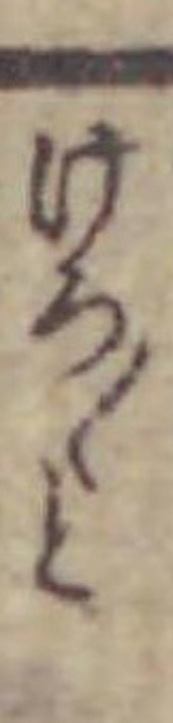けろ〳〵と
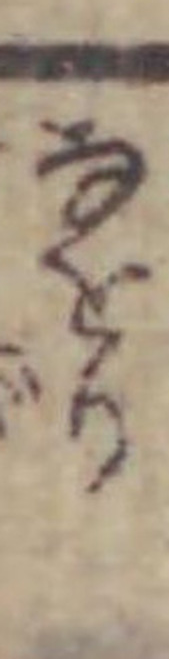なをり
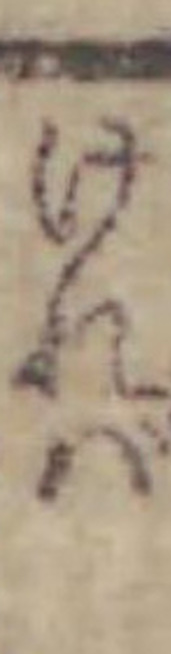ければ
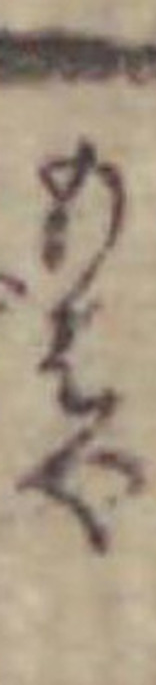もはや
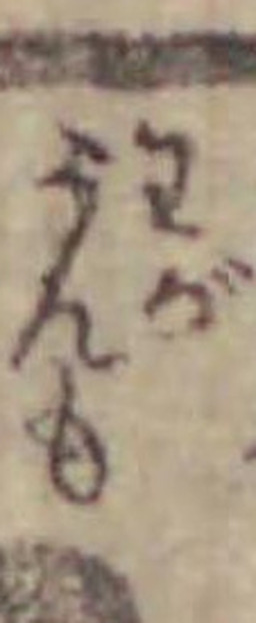うんも
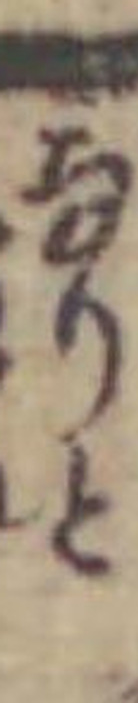なりと
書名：莫切自根金生木 : 3巻
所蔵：国立国会図書館 National Diet Library, JAPAN
